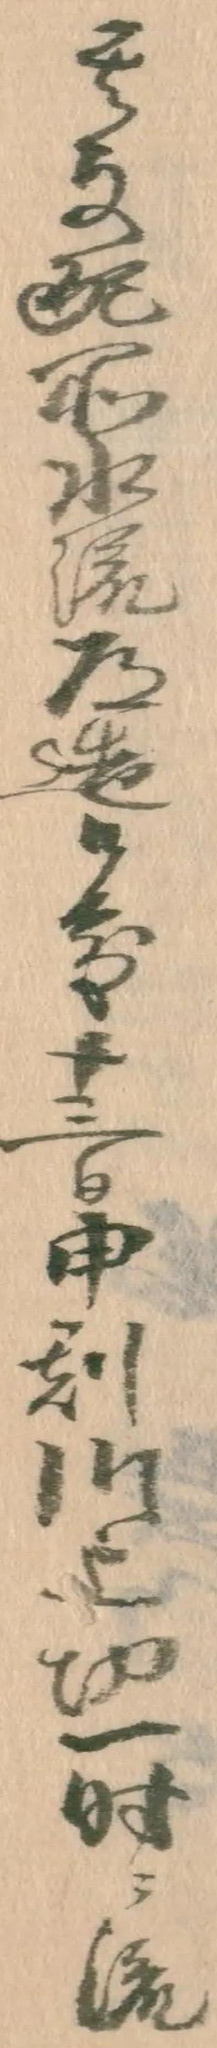其支配所水流道造候処十三日申刻川上切一時二流
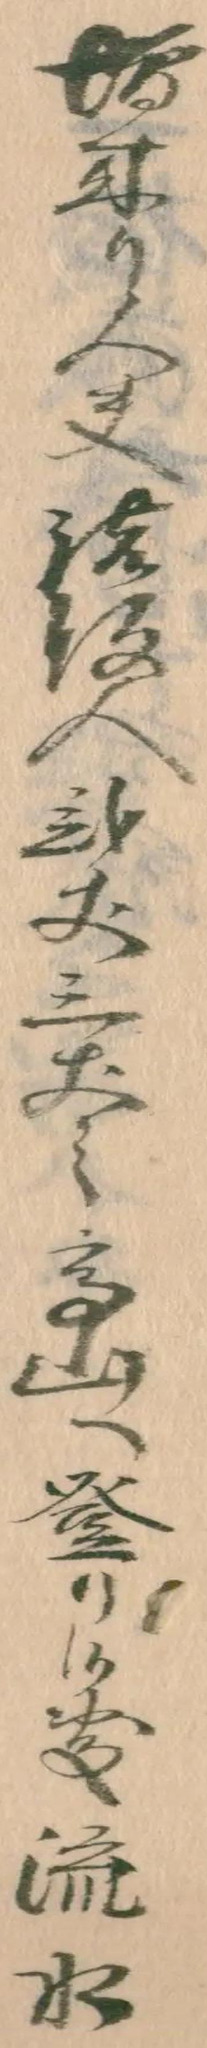増来り人夫諸役人弐丈三丈之高山へ登り候処流水
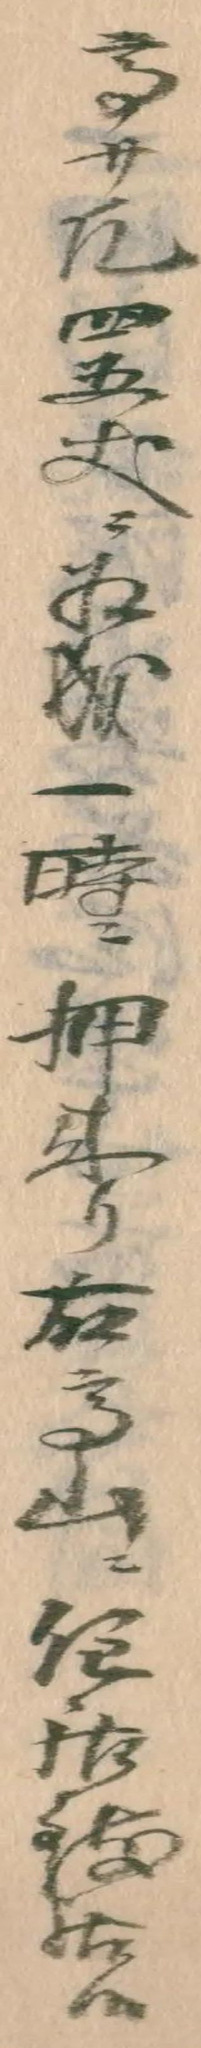高サ凡四五丈二相成一時二押来り右高山二住居致居候
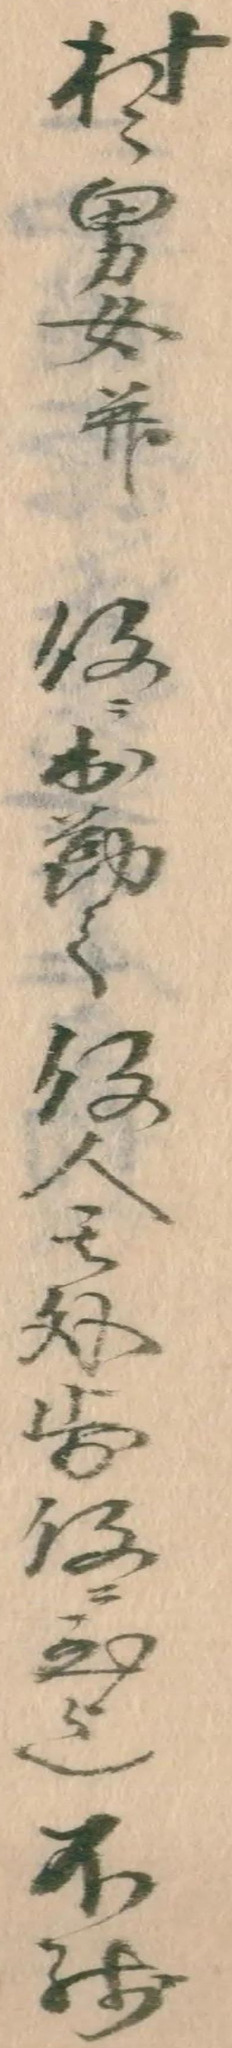村々男女并役二出勤之役人其外歩役二至迄不残
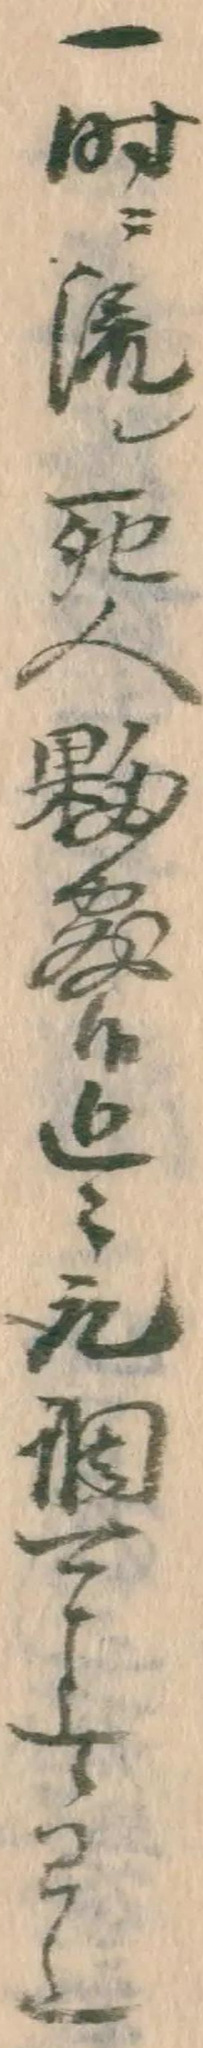一時二流レ死人夥敷候追々取調可申上候善已上
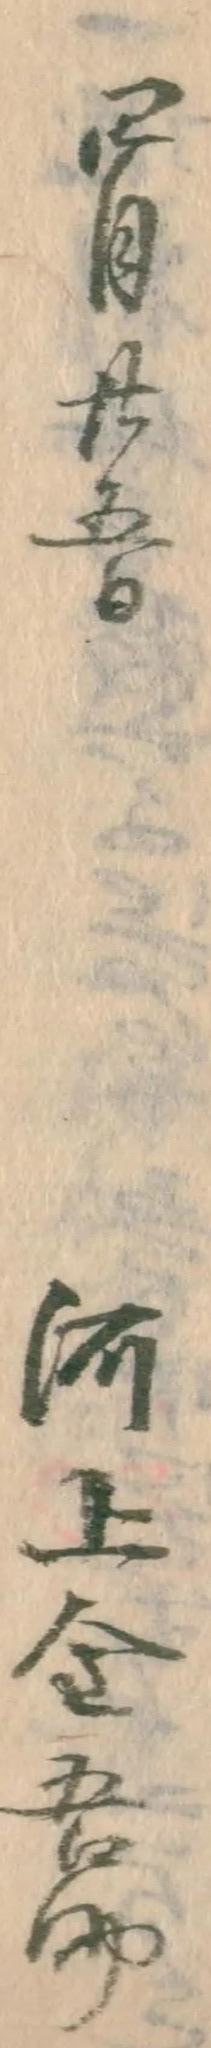四月廿五日川上金吾助
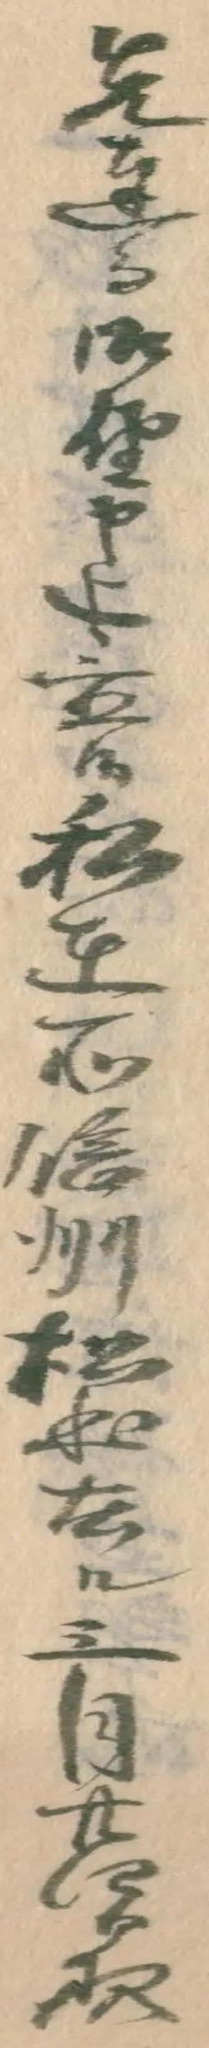先達而御届申上置候私在所信州松本去ル三月廿四日夜
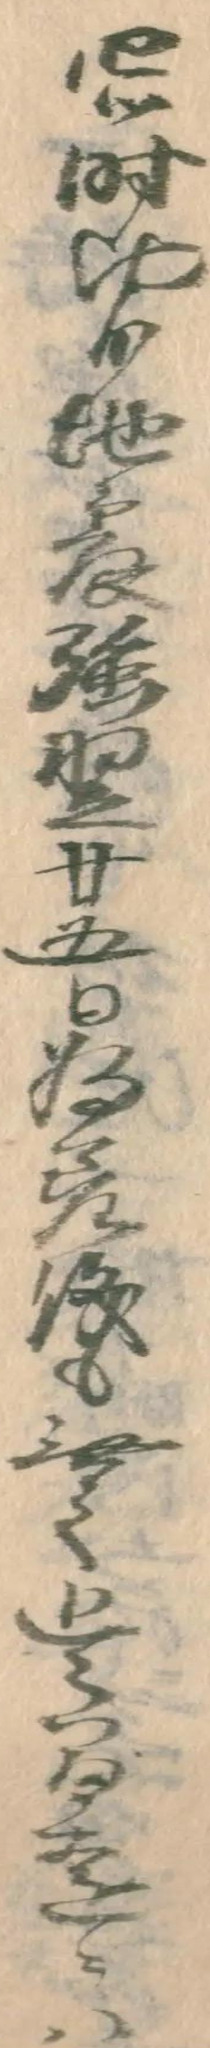四ツ時比ゟ地震強翌廿五日為差儀も無之追々間遠二ハ
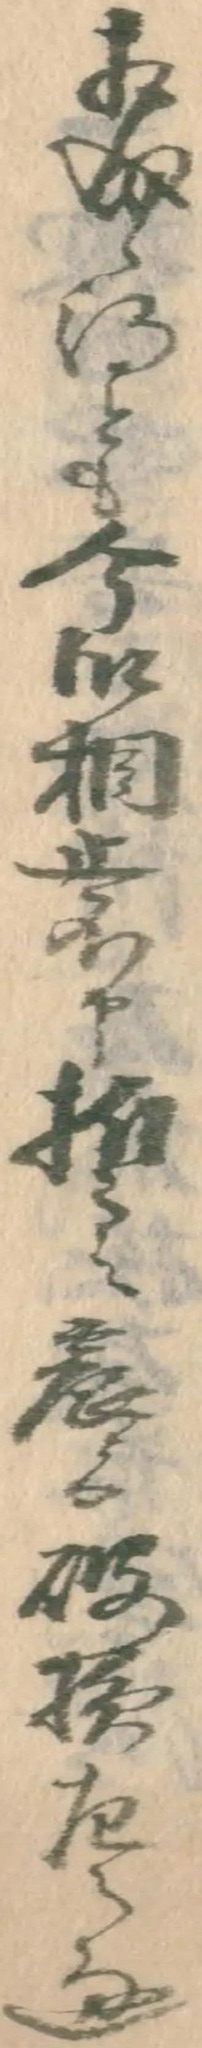相成候得とも今以相止不折々震候而破損左之通

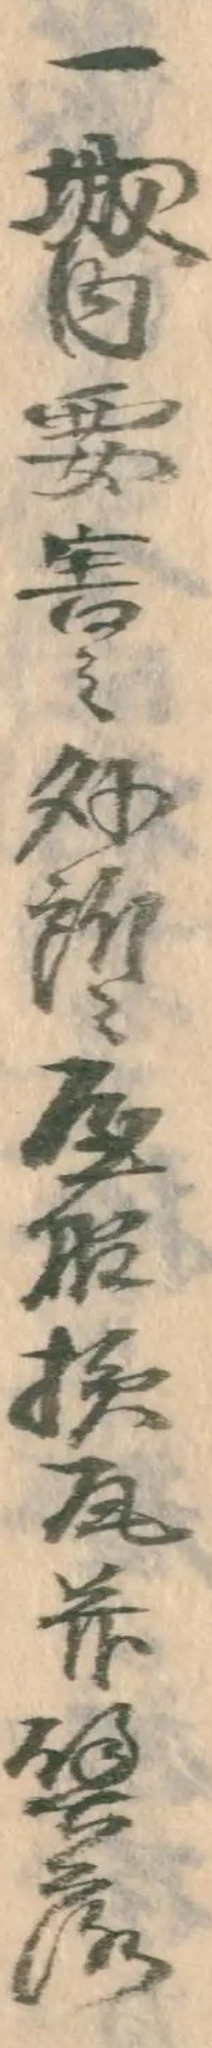一城内要害之外所々屋根損瓦并壁落
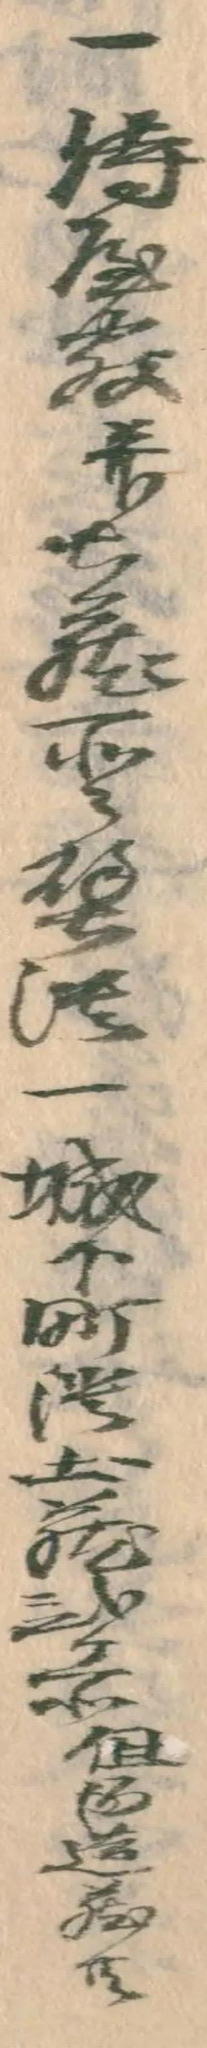一侍屋敷并土蔵所々壁潰一城下町潰土蔵弐ヶ所但酒造蔵共
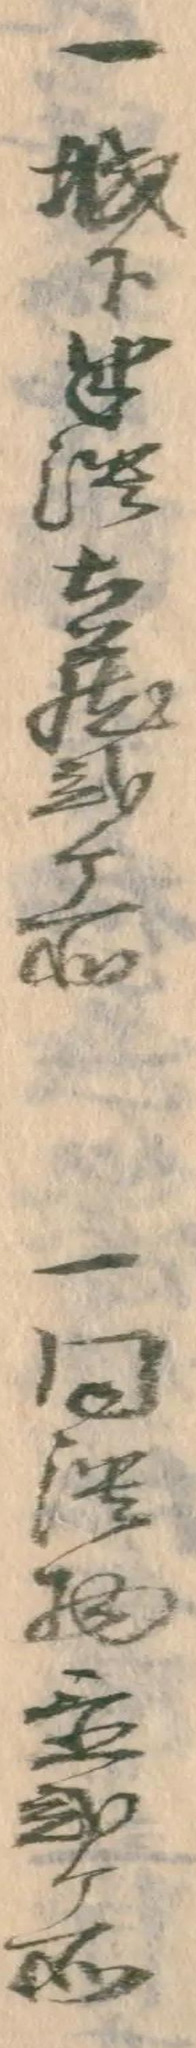一城下半潰土蔵弐ヶ所一同潰物置弐ヶ所
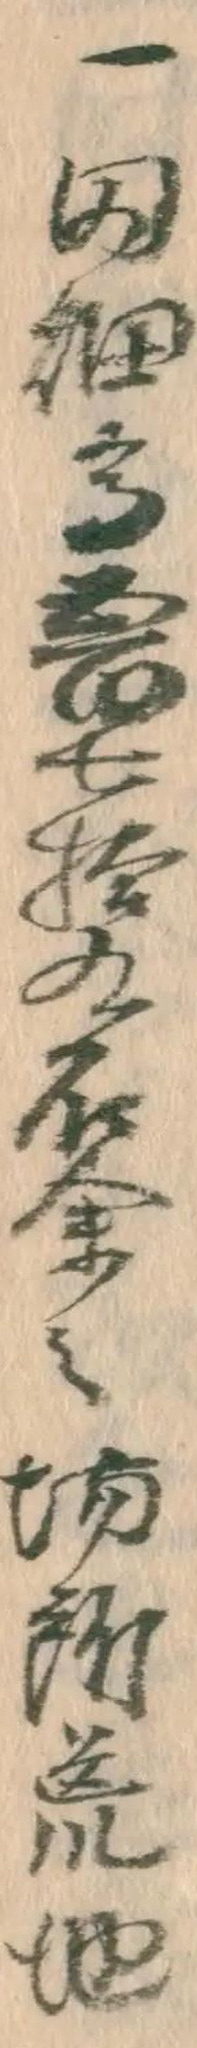一田畑高五百七拾九石余之場所荒地
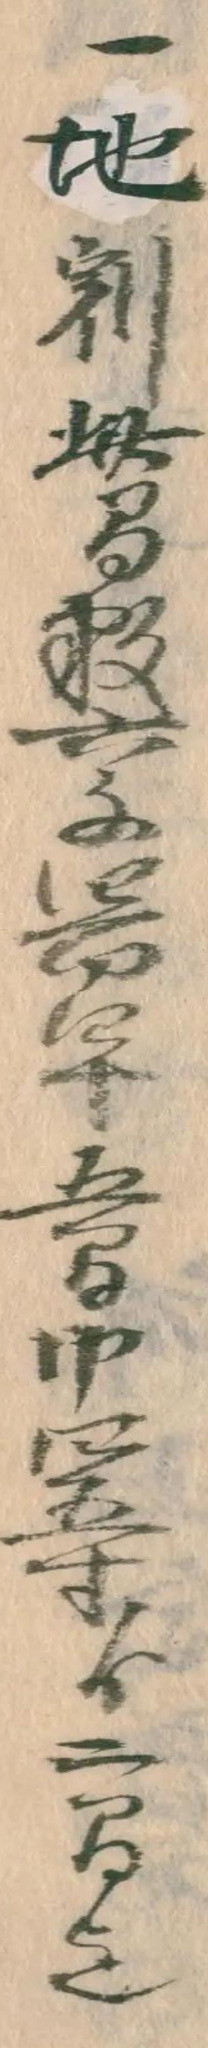一地割此間数六千四百四十五間巾四五寸ゟ二尺迄
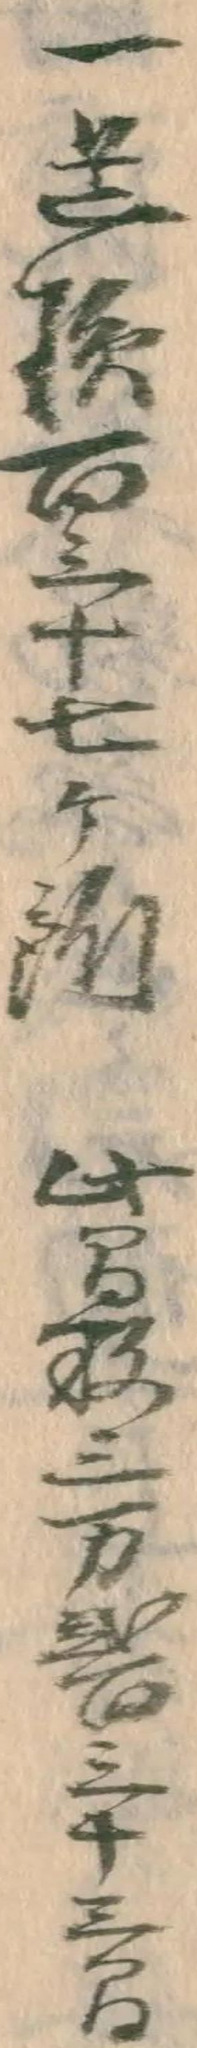一道損百三十七ヶ所此間数三万弐百三十三間
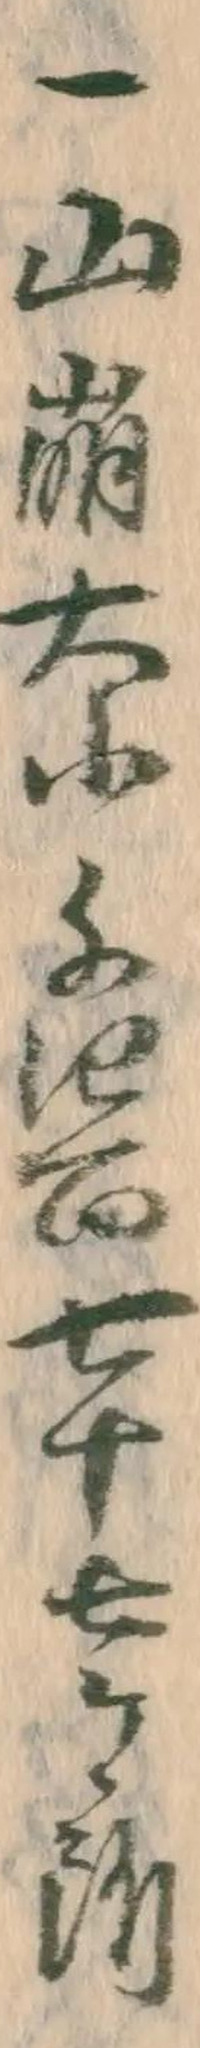一山崩大小千四百七十七ヶ所
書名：信州大地震之記
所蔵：国立国会図書館 National Diet Library, JAPAN
